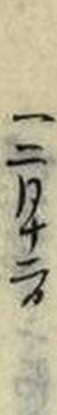一二月七日
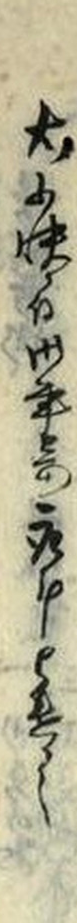右不快ニ付御年寄取計被遣之

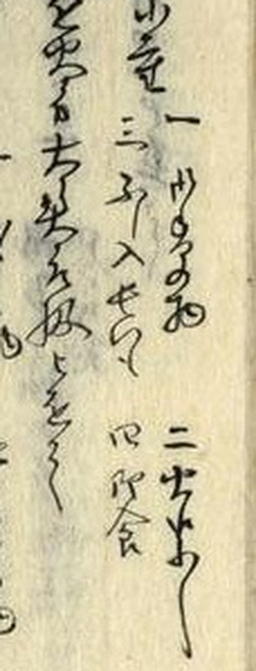三ふし入長いも四御食
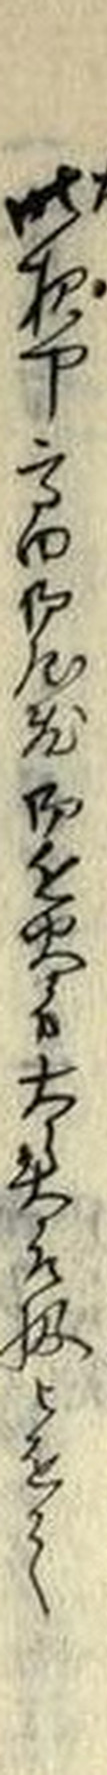右昨夜中高田御屋敷御近火ニ付大奥取扱被進之
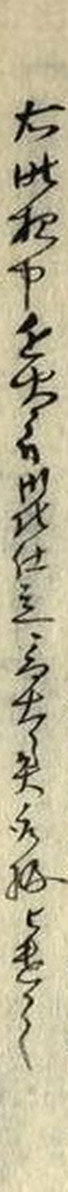右昨夜中近火ニ付御次仕立ニ而大奥取扱被遣之
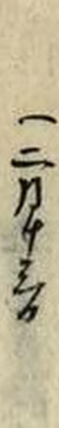一二月十四日
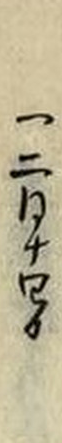一二月十四日
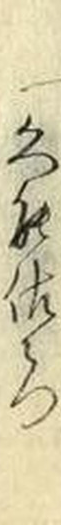久能佐右衛門
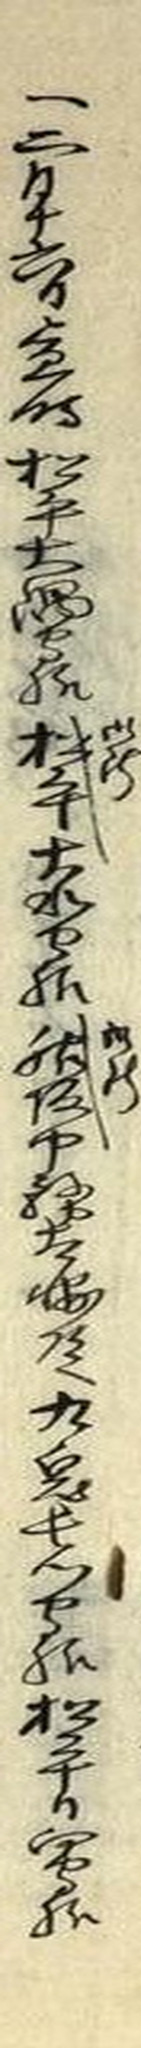一二月十六日昼時松平大隅守様松平大和守様脇坂中務太輔殿九鬼長門守様松平日向守様
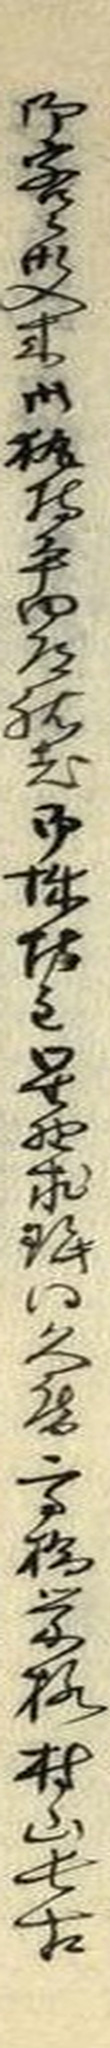御客ニ御入来御執持平田道祐老御城坊主星野求珉同久庵高橋栄格村山長古
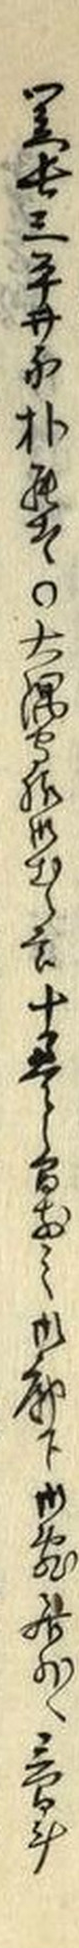関長三平井永朴罷出候〇大隅守様御出候節十畳之間前之御廊下御敷居外へ三間斗
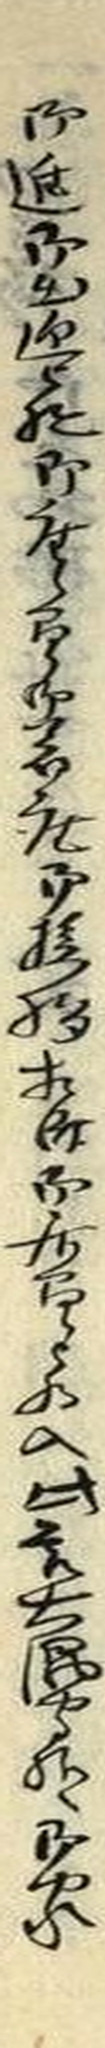御進御出迎被遊御座之間御着座御挨拶相済御居間へ被為入此節大隅守様へ御家
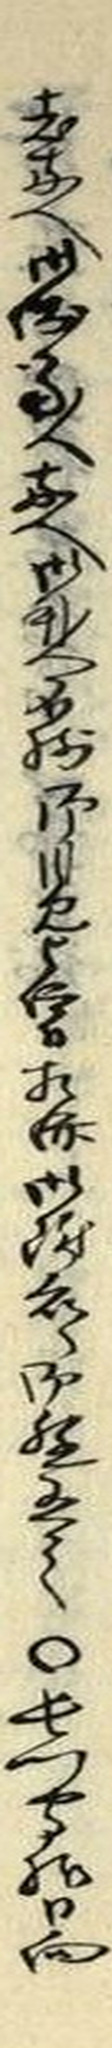老両人御側御用人両人御用人不残御目見被仰付相済御附衆へ御逢有之〇長門守様日向
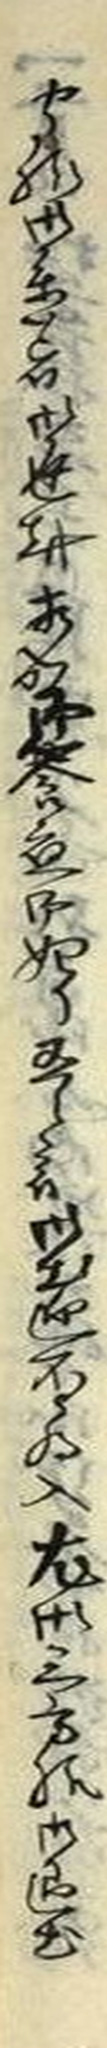守様御参着御遅刻相成御饗応御始り有之候ニ付御出迎不被為入尤御三方様御退出
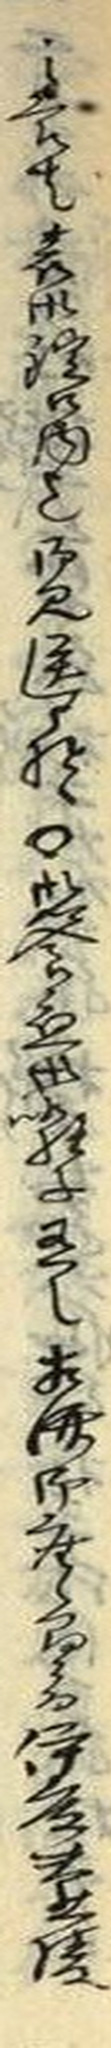之節者表御錠口内迄御見送被遊候〇御饗応御囃子有之相済御座之間ニ而伊藤燕凌
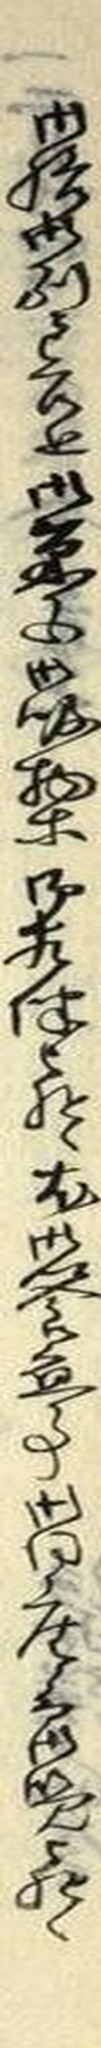御膳御別ニ被召上御菓子御吸物等御相伴被遊候尤御饗応事御同座ニ而御覧被遊候
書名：少傅日録抄（斉善付側向頭取日記、在府）
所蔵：福井県文書館 Fukui Prefectural Archives
